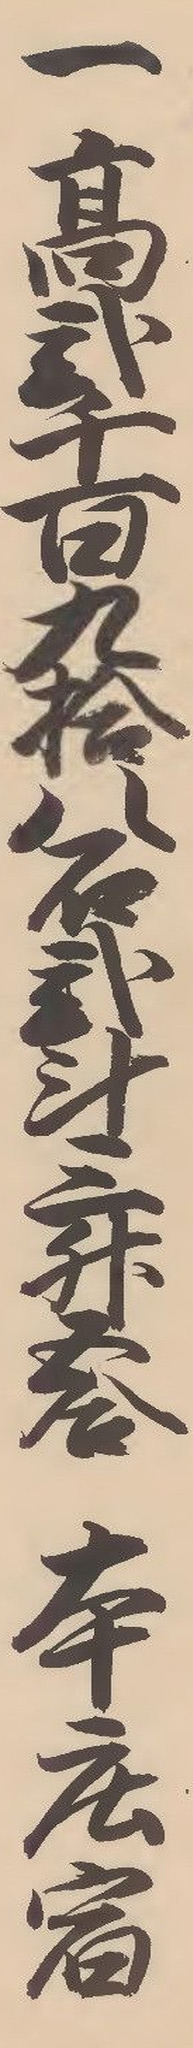一高弐千百九拾八石弐斗三升五合本庄宿
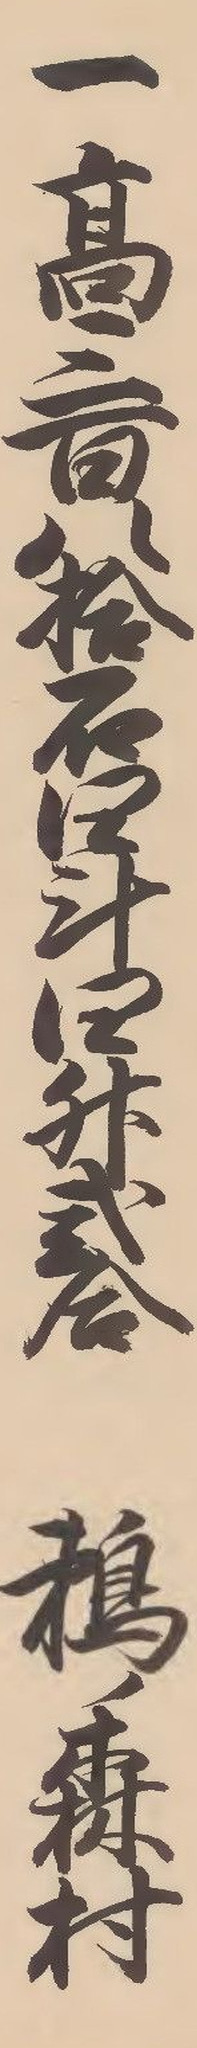一高三百八拾石四斗四升弐合鵜ノ森村
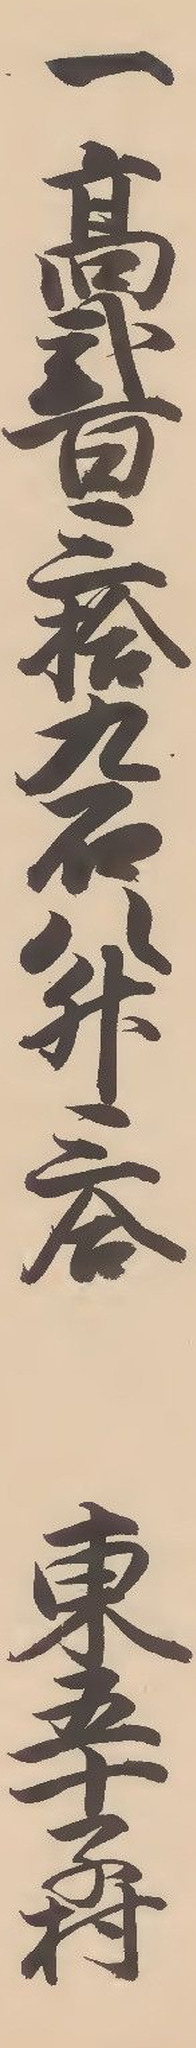一高弐百三拾九石八升三合東五十子村
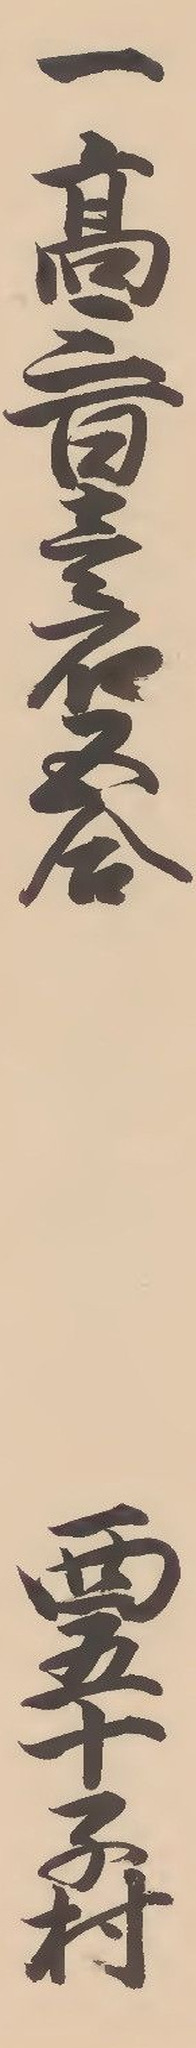一高三百壱石五合西五十子村

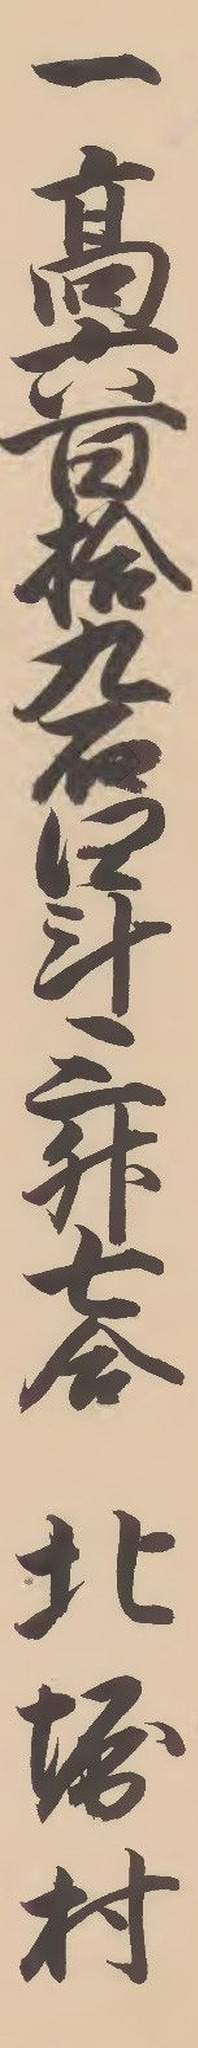一高六百拾九石四斗三升七合北堀村
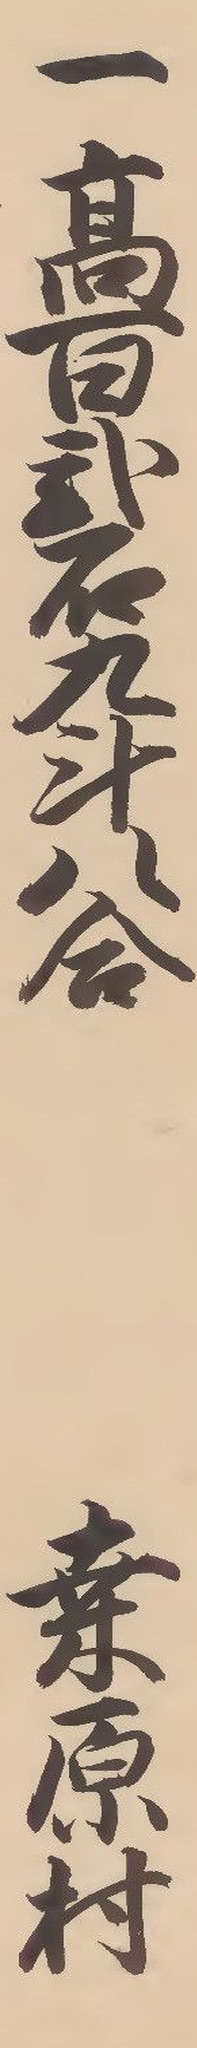一高百弐石九斗八合桑原村
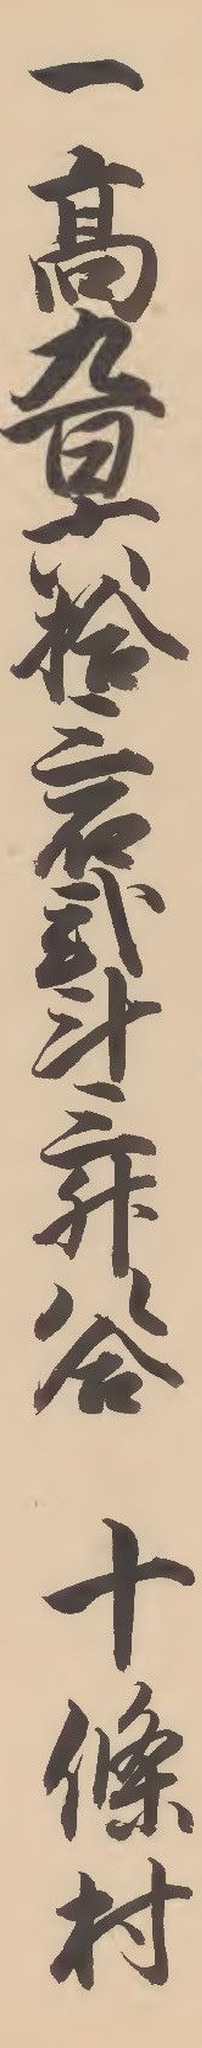一高九百六拾三石弐斗三升八合十條村
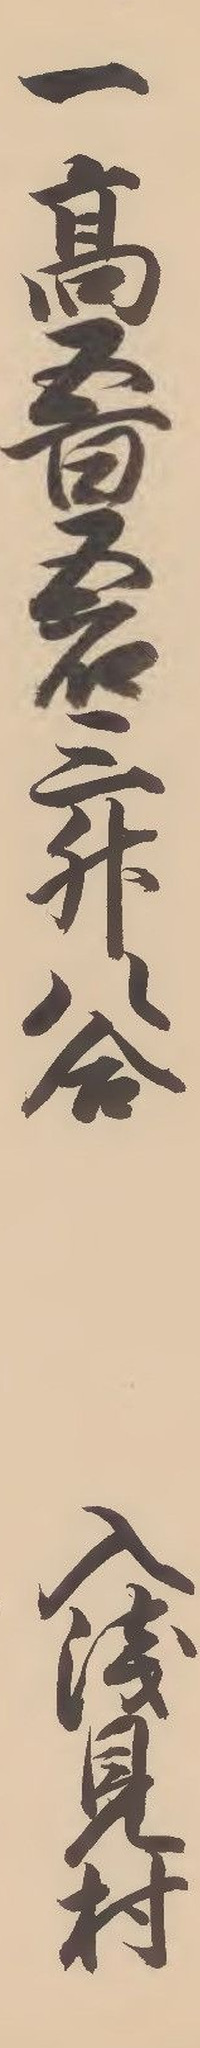一高五百五石三升八合入浅見村
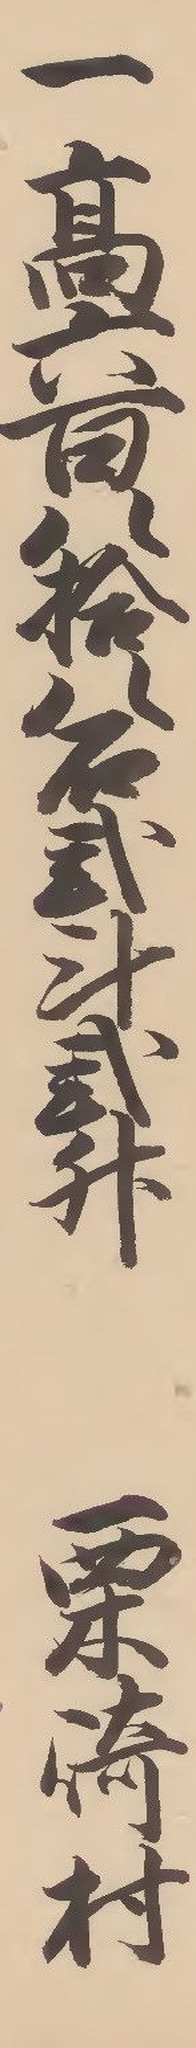一高六百八拾八石弐斗弐升栗崎村

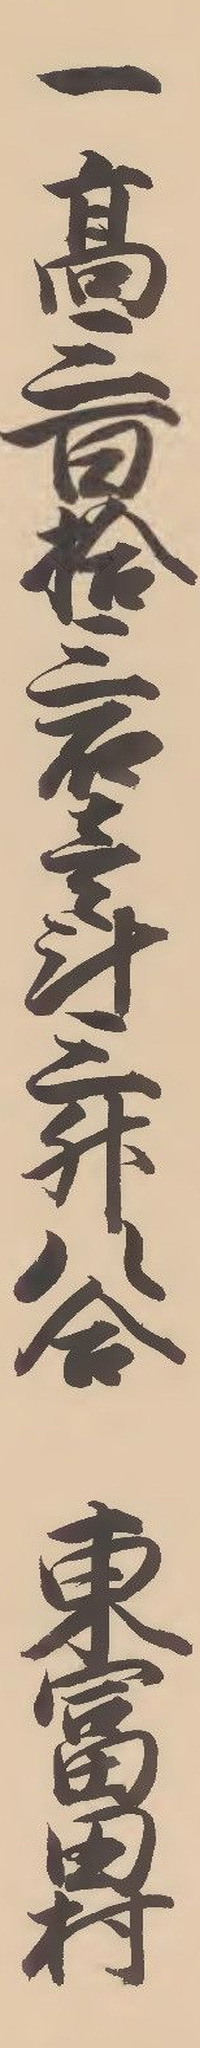一高三百拾三石壱斗三升八合東冨田村
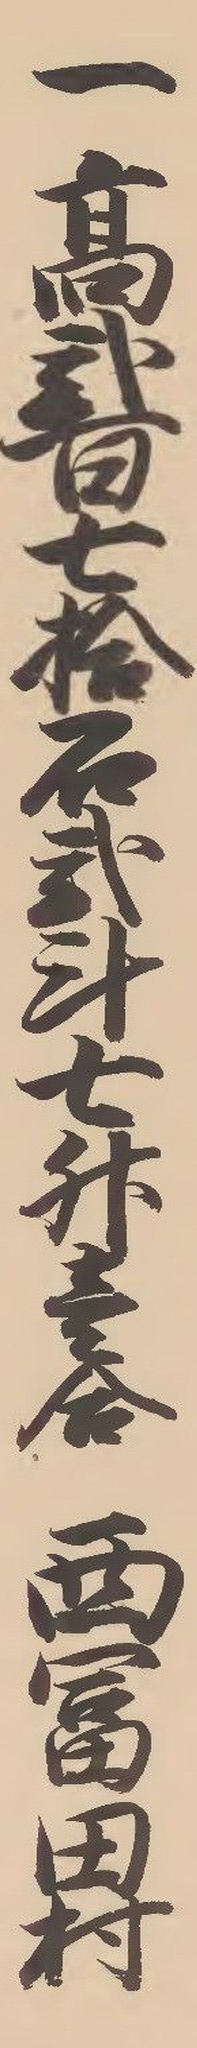一高弐百七拾石弐斗七升壱合西冨田村
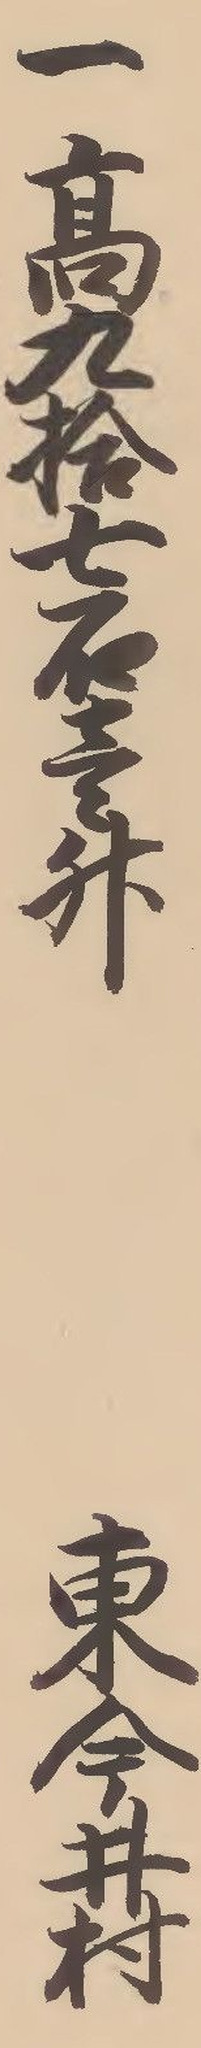一高九拾七石壱升東今井村
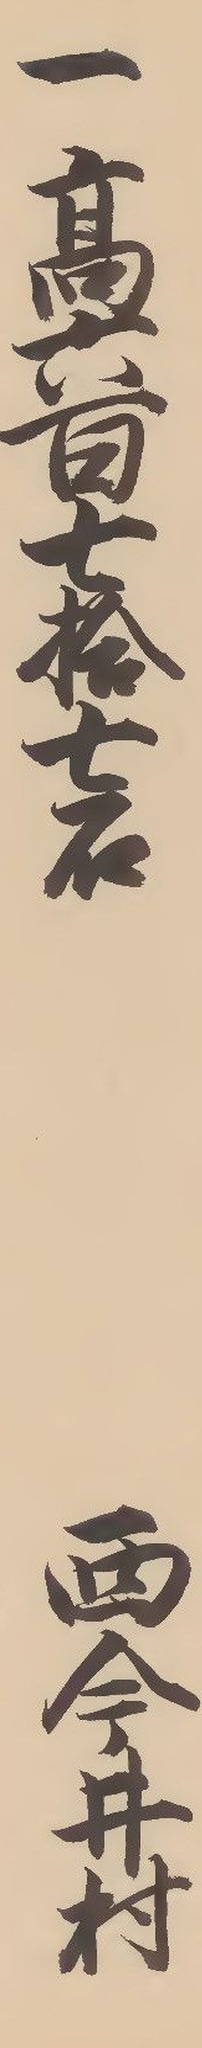一高六百七拾七石西今井村
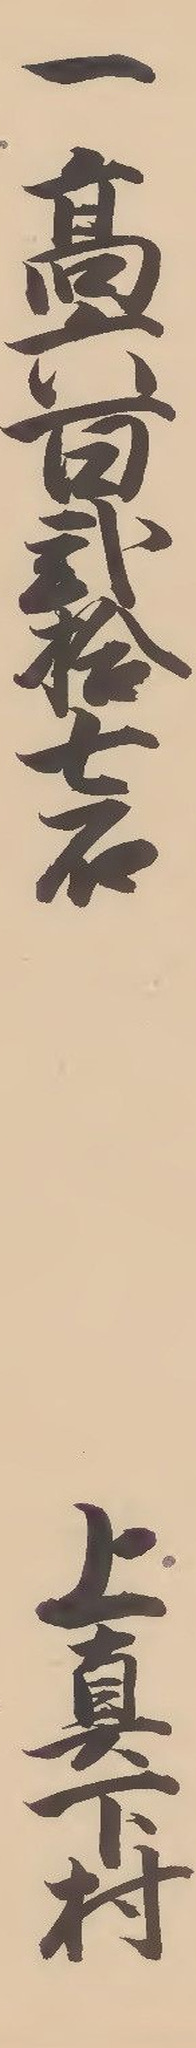一高六百弐拾七石上真下村

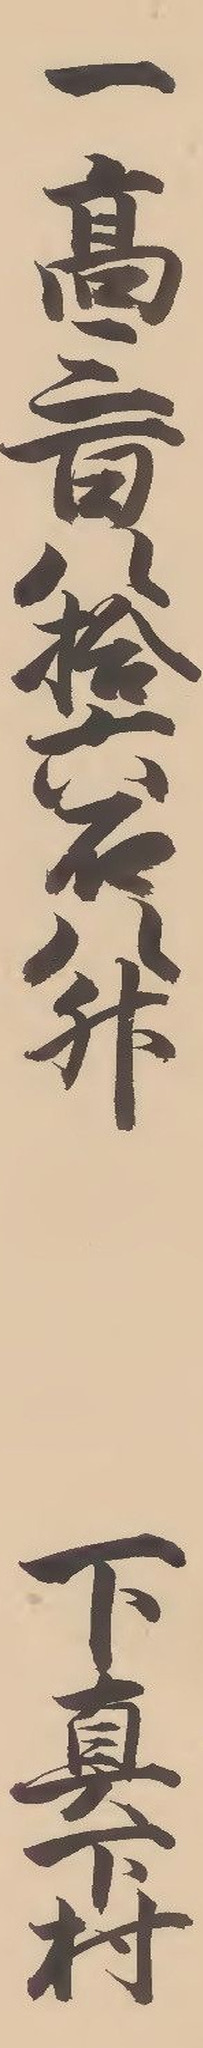一高三百八拾六石八升下真下村
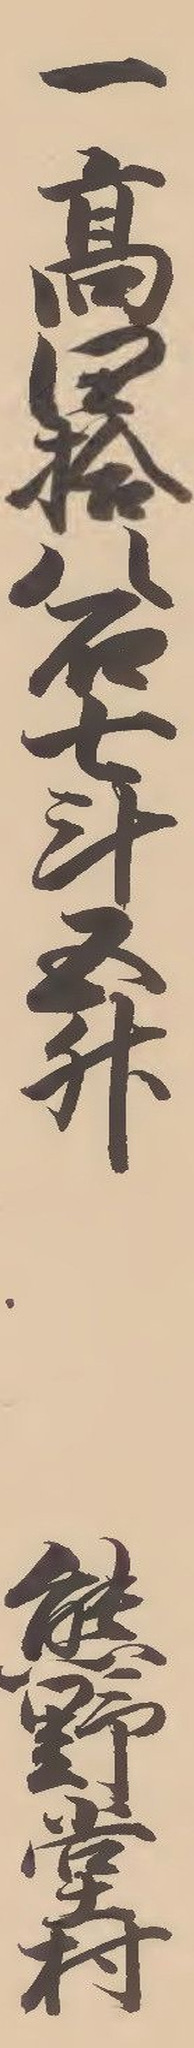一高四拾八石七斗五升熊野堂村
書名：武蔵国郷帳　下
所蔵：国立公文書館 National Archives of Japan
